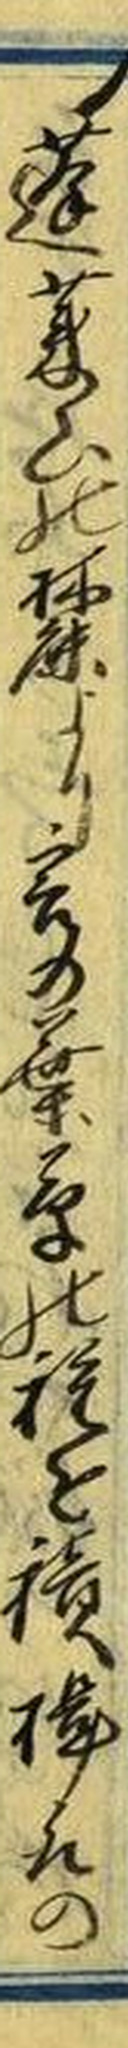蓬莱山の麓より言の葉草の種を積揖取の
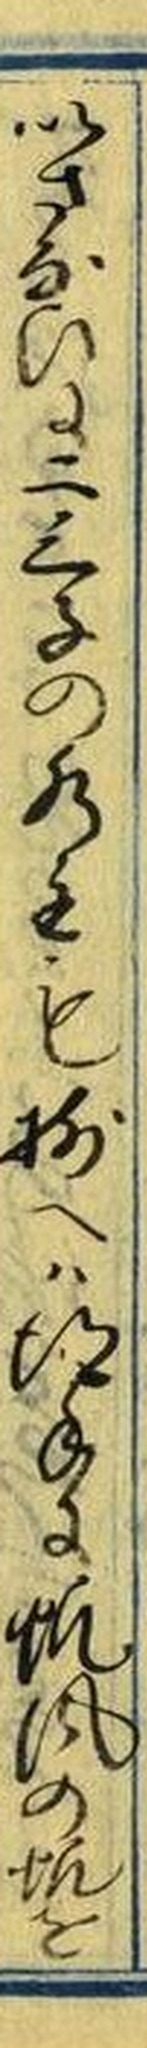いさなひに二三子の水主も揃へは得手に帆風の帆を
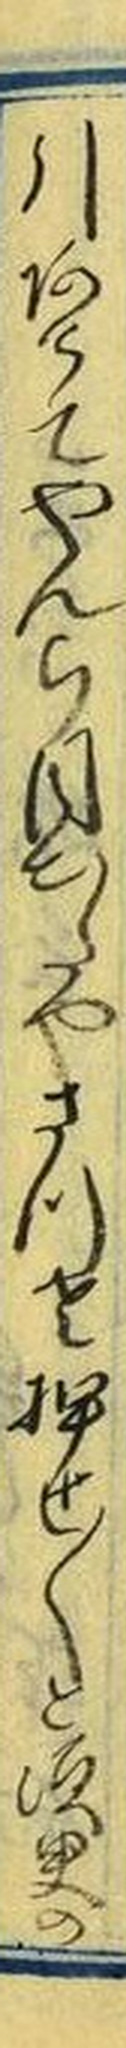引あけてやんら目出たやさつさ押せ〳〵と須臾の
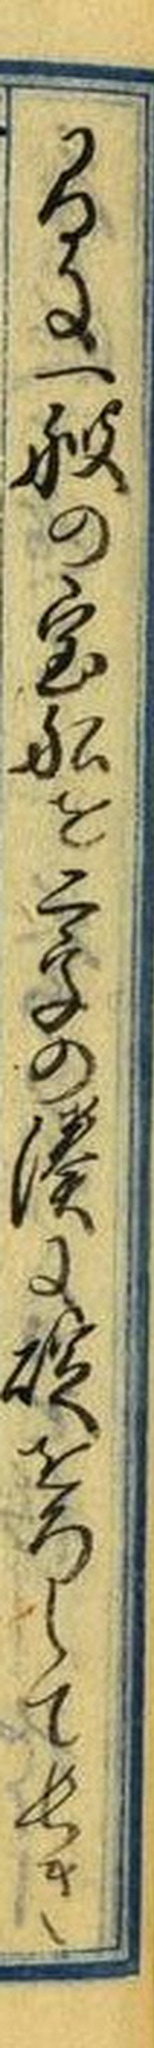間に一艘の宝船を二字の湊に碇をろして長き
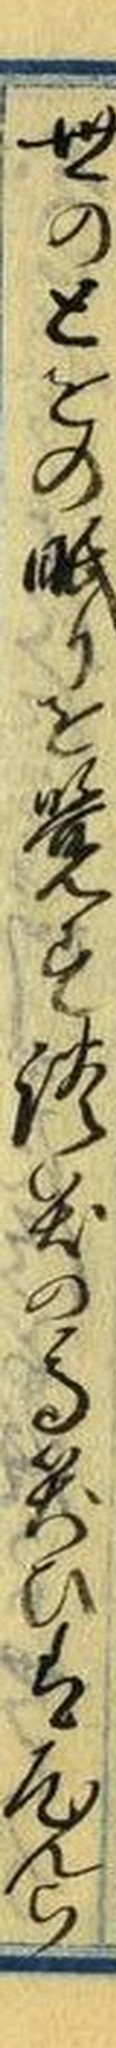世のとをの眠りを覚す談笑の高笑ひはやんら
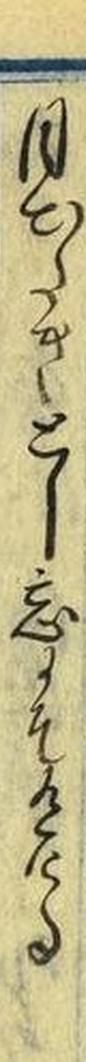目出たきとし忘にそ有ける
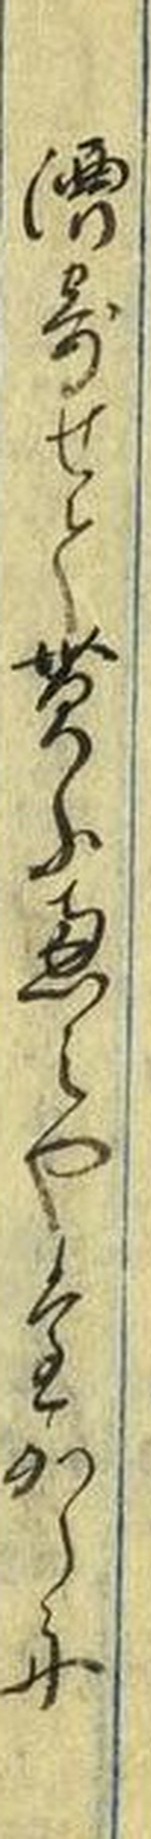漕寄せて貰ふ恵みやたから舟
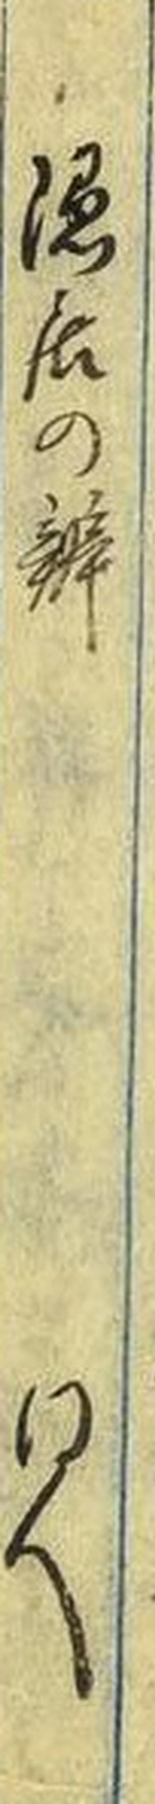隠居の弁同人
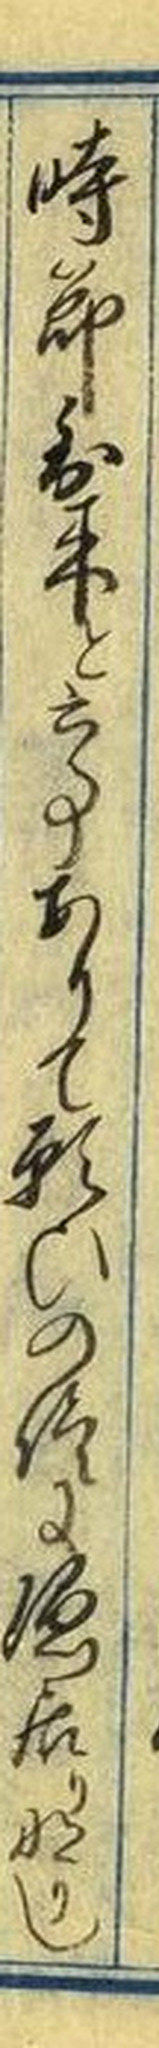時節到来と言事ありて願ひの侭に隠居りなりし
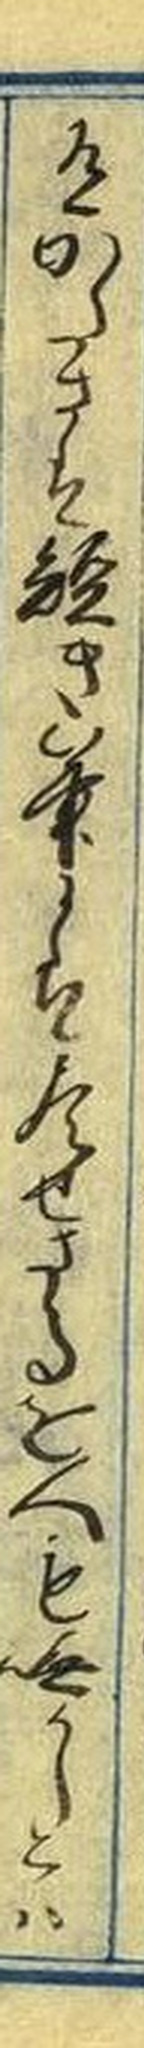有かたさは短き筆には尽せさるを人も嘸かしとは
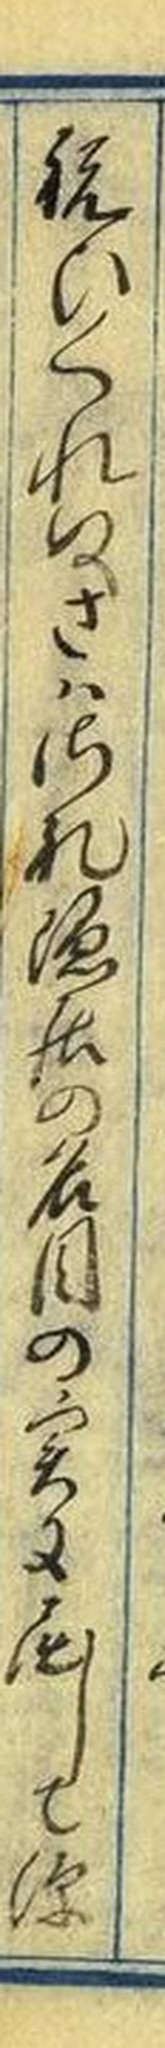祝ひくれぬさはされ隠居の名目の実に屈して深
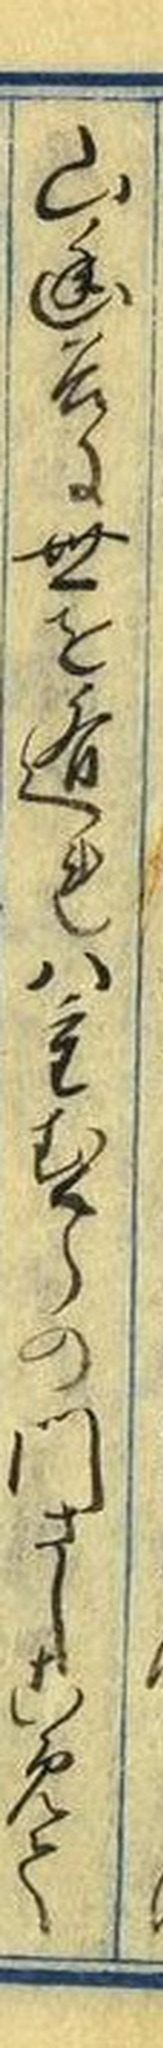山幽谷に世を遁れ八重むくらの門さしこめて
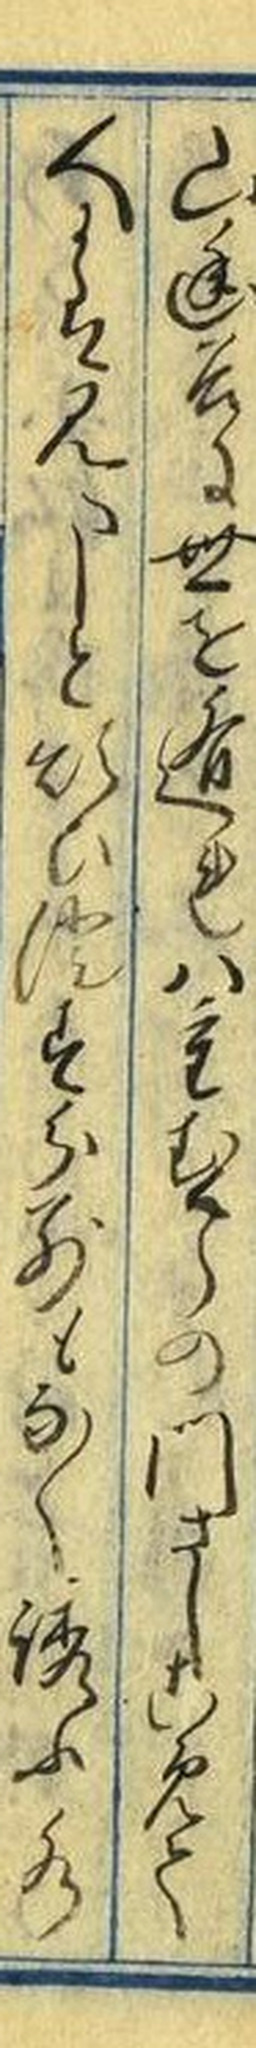人には見へしと煩ひ証す分別もなく誘ふ水

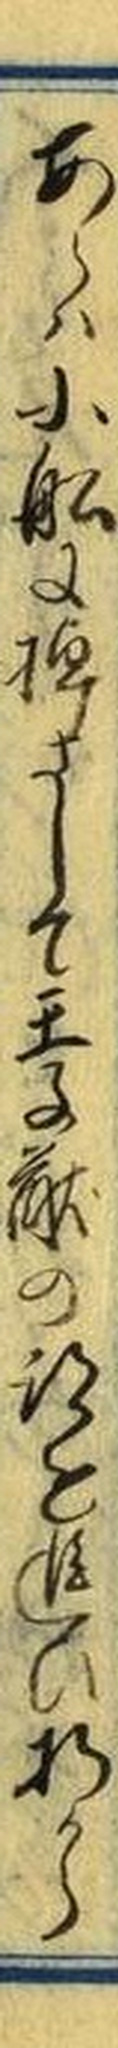あらは小船に棹さして王子猷の跡を追ひ折から
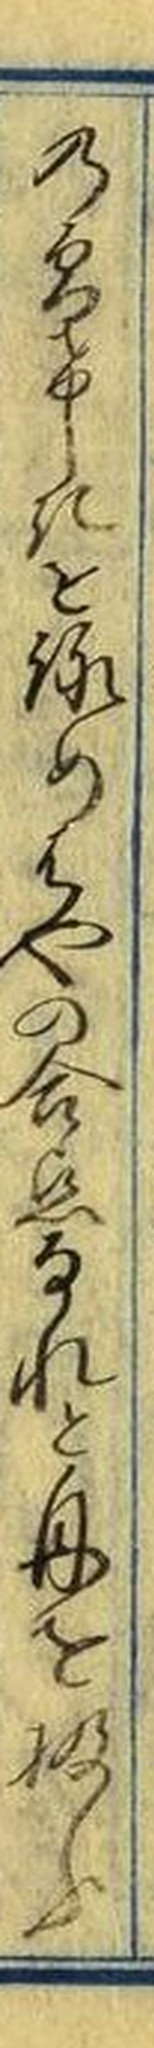の雪けしきを詠めはやの合点なれと舟を扱ふ
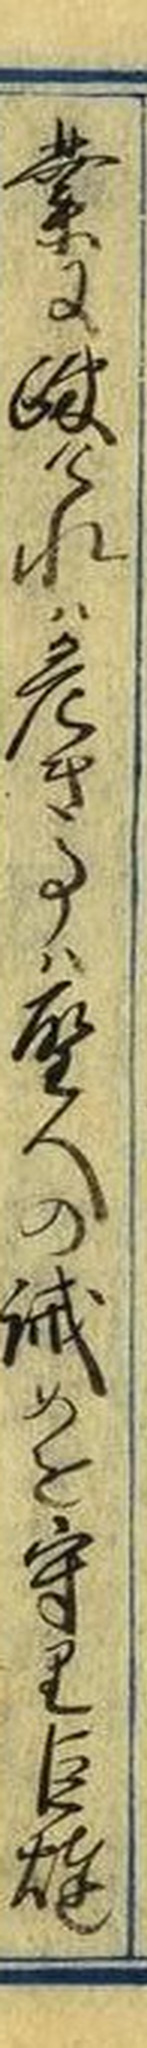業に疎けれは危き事は聖人の誡めを守り巨燵
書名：温古集 三巻
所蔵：福井県文書館 Fukui Prefectural Archives
